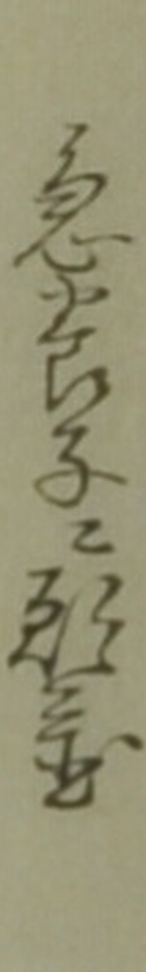急養子ニ願置
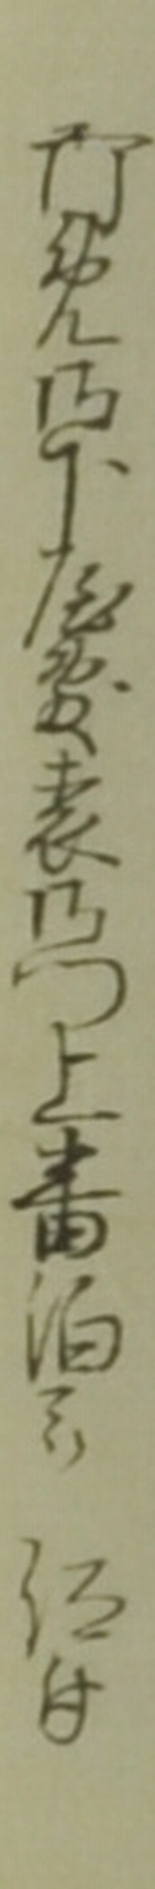御免御下屋敷表御門上番泊被仰付
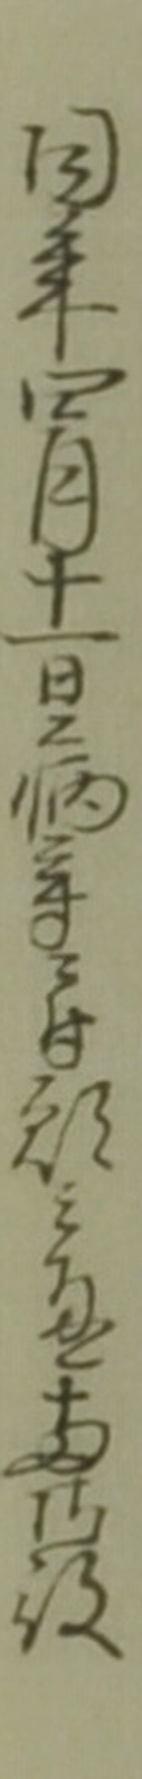一同年四月十一日病気ニ付願之通両御役

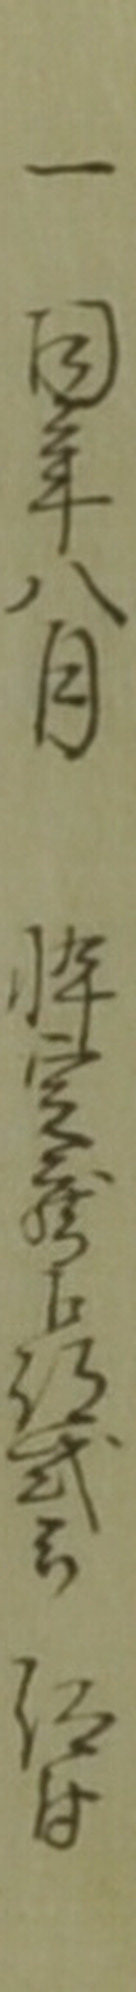一同年八月忰定蔵江跡式被仰付
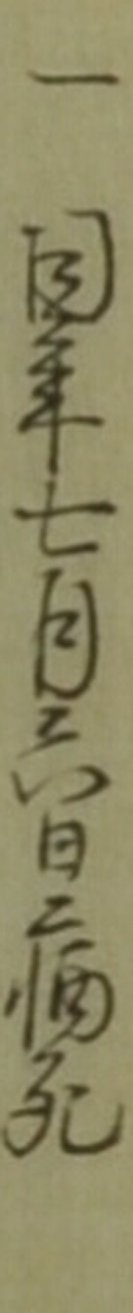一同年七月六日病死
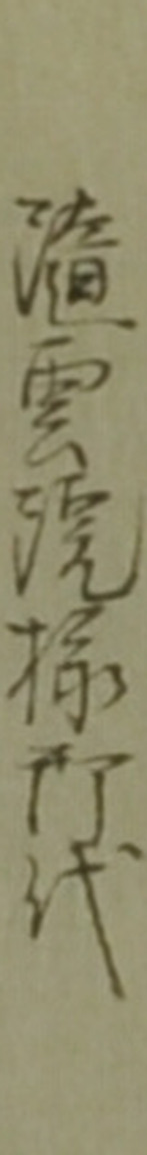随雲院様御代
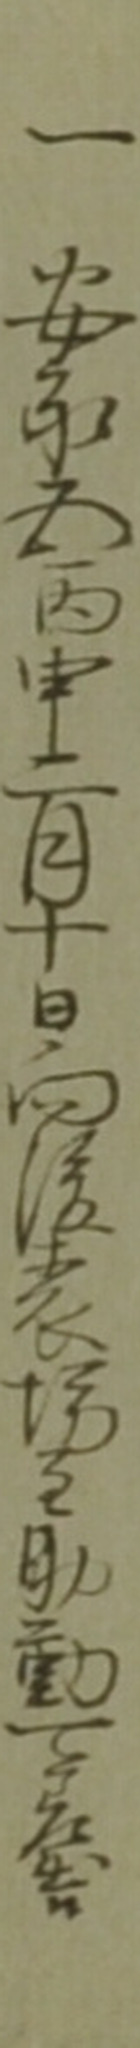一安永五丙申二月十日向後表坊主助勤可差出候
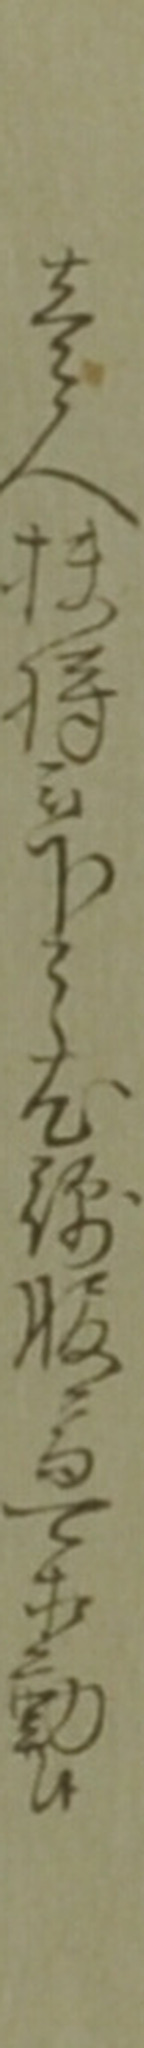壱人扶持被下之尤綿服ニ而可相勤候
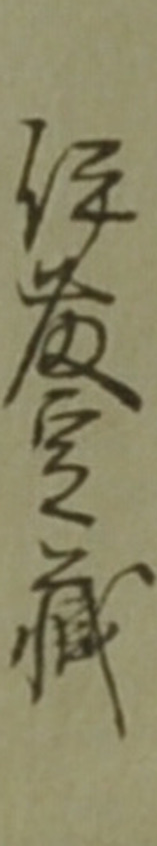伊藤定蔵
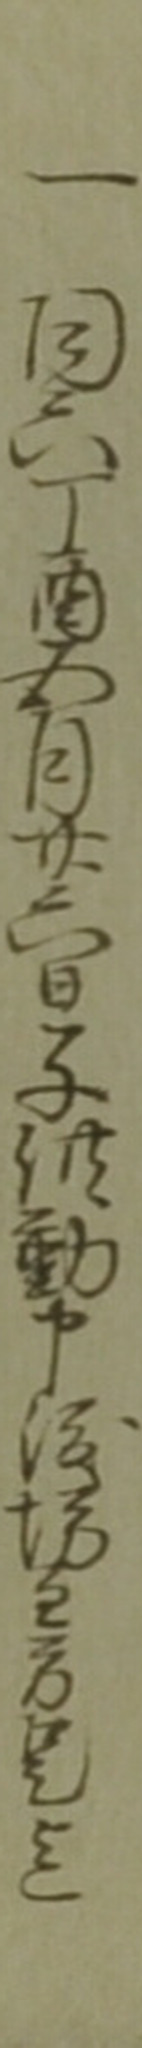一同六丁酉五月廿六日子供勤申渡坊主方是迄
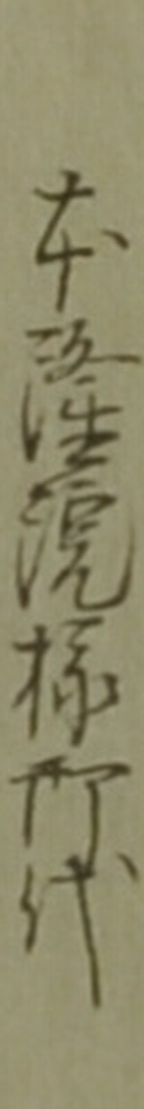本隆院様御代
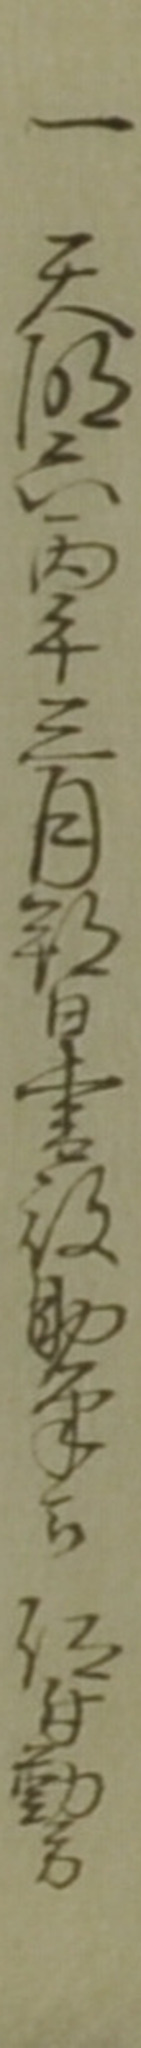一天明六丙午三月朔日書役助筆被仰付勤方
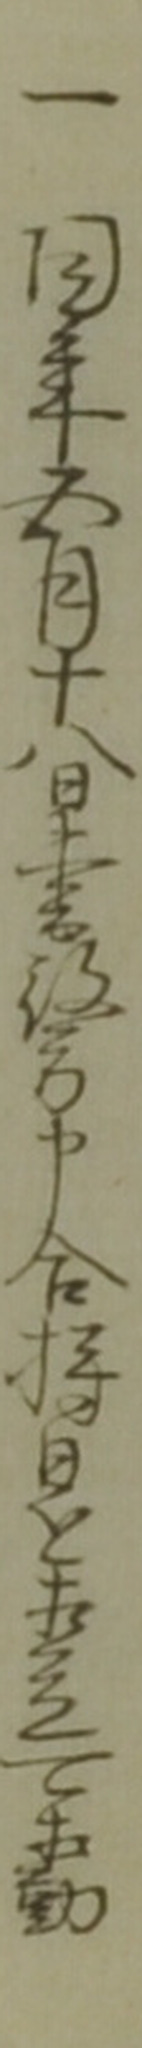一同年五月十八日書役方申合持日を相立可相勤
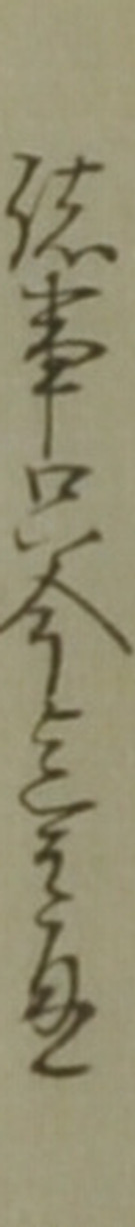諸事只今迄之通
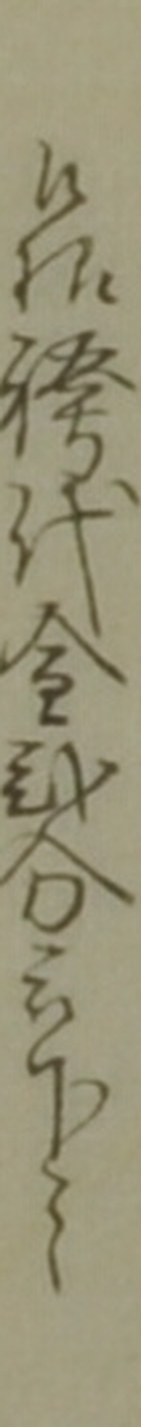候様袴代金弐分被下之
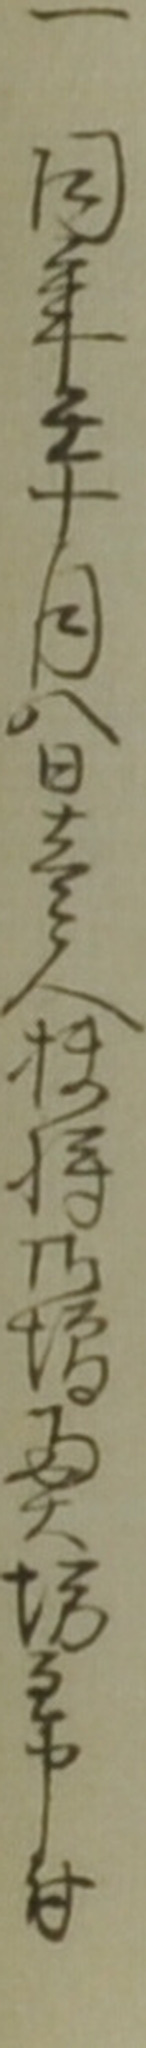一同年閏十月八日壱人扶持御増奥坊主申付
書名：無足諸士勤仕録（九）
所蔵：伊那市立高遠町図書館・合同会社AMANE
